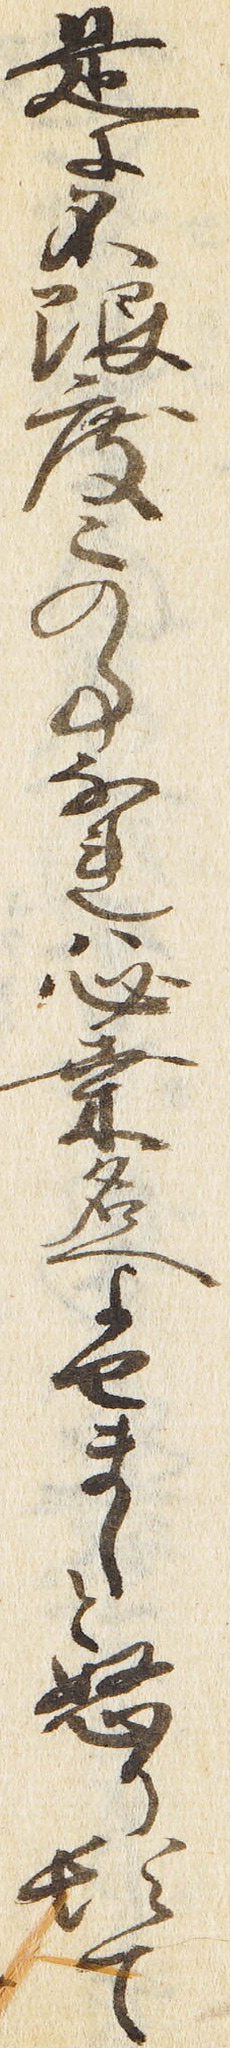是に不限度々の事なれは必桑名へよせましと怒り頓て
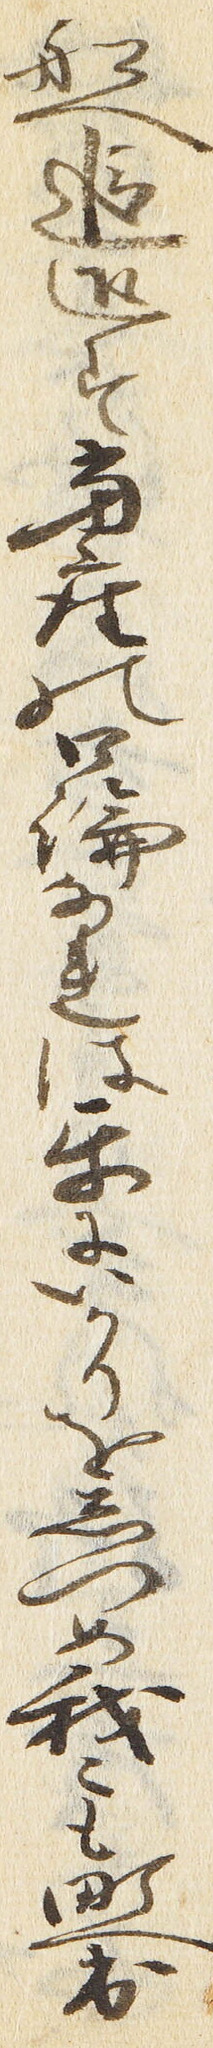船人追返す当座の口論なれは互にいかりをしつめ我々も町へ出
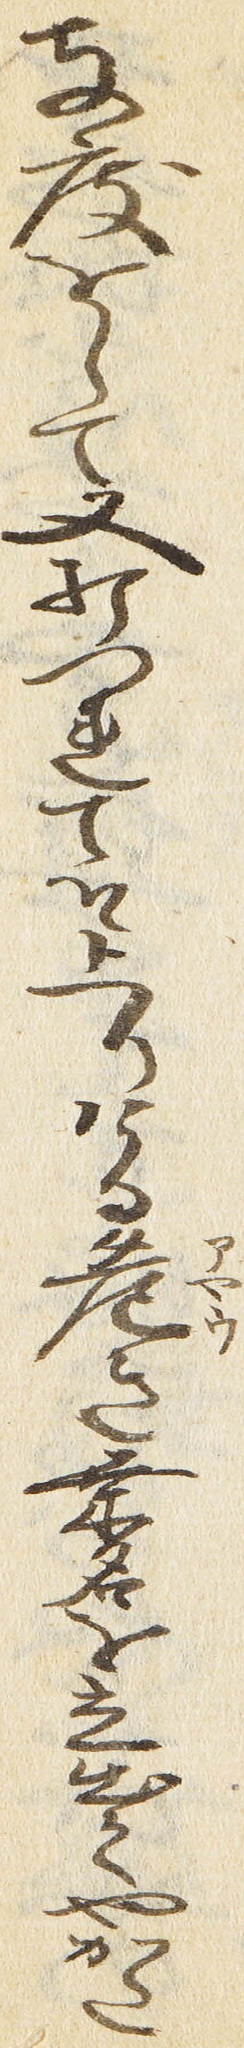支度をして又打つれてそ上りける危き桑名を立出てやかた
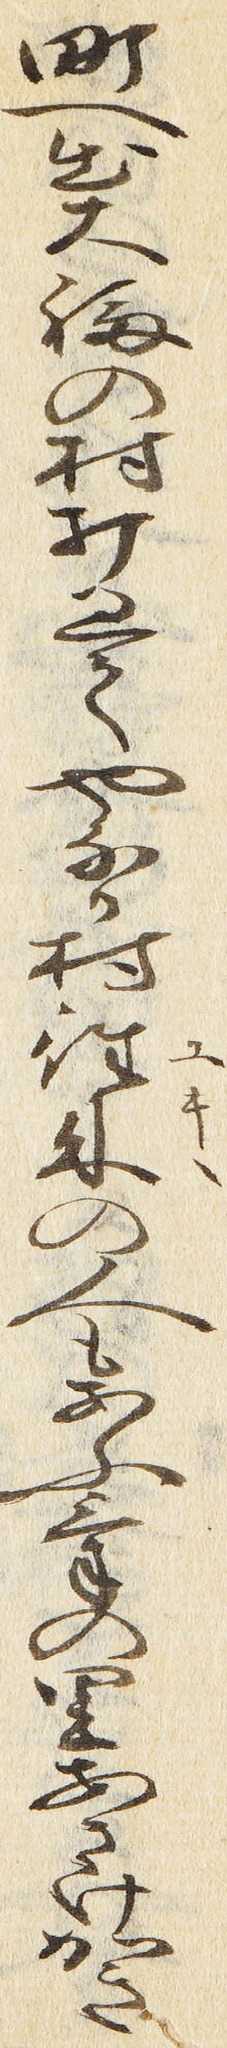町へ出大福の村打過てやなか村往来の人もあふ気の里あさけかき
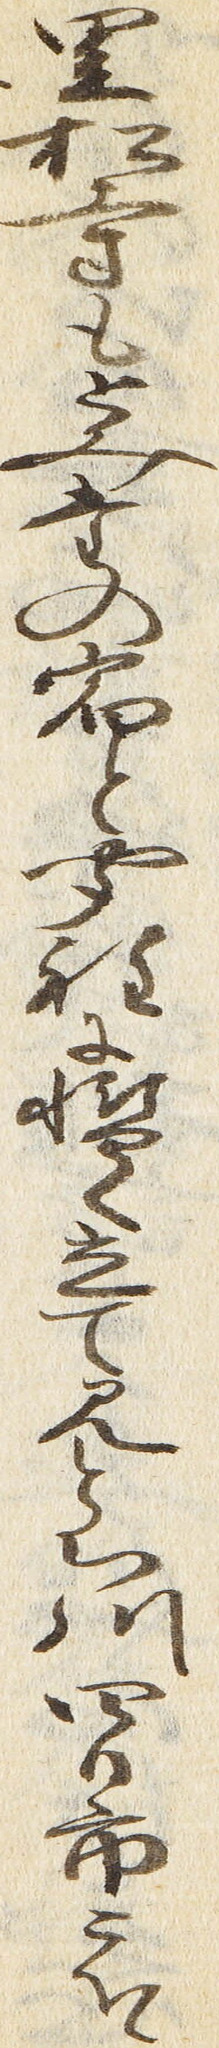里松寺もとみたの宿と聞程に暫く立て見とち川四日市こそ
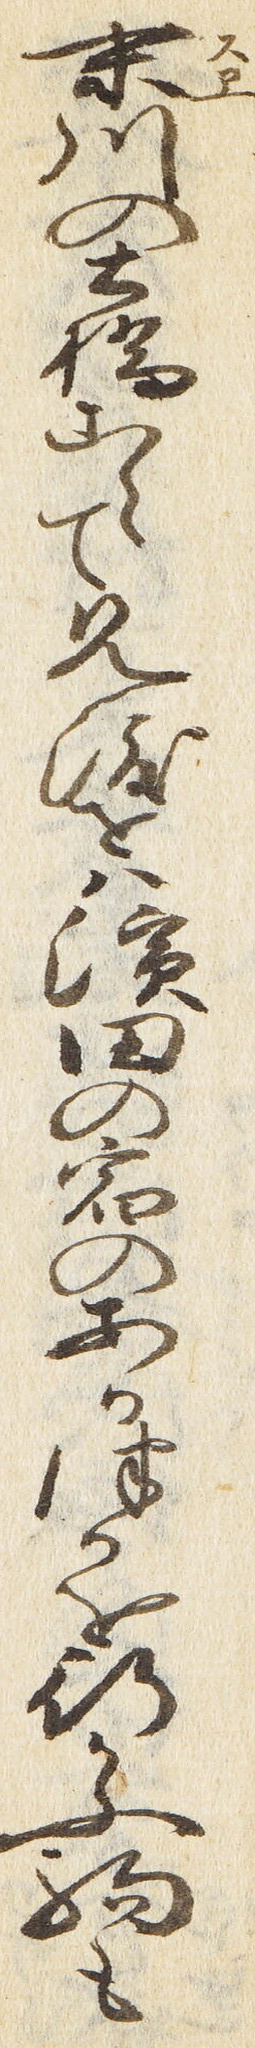末川の土橋こえて見渡をは浜田の宿のあかつかを行かふ駒も
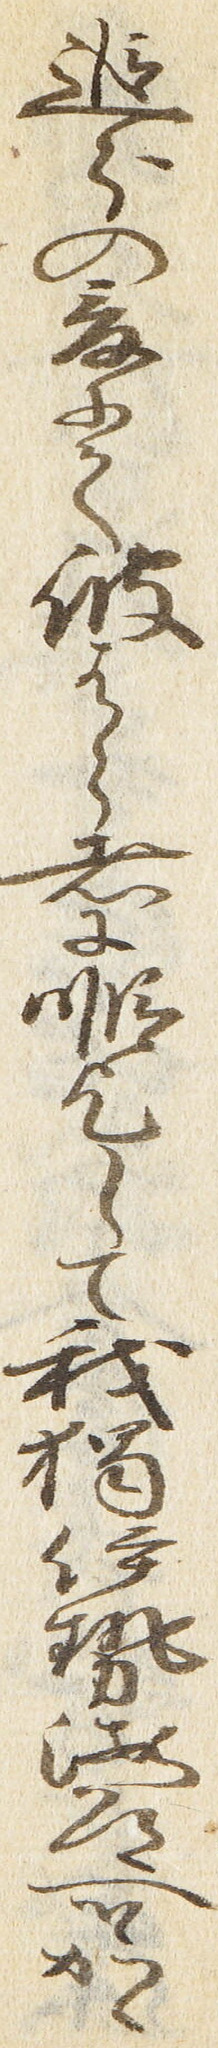追分の爰にて彼はら者に暇乞して我独伊勢海道へそかゝ
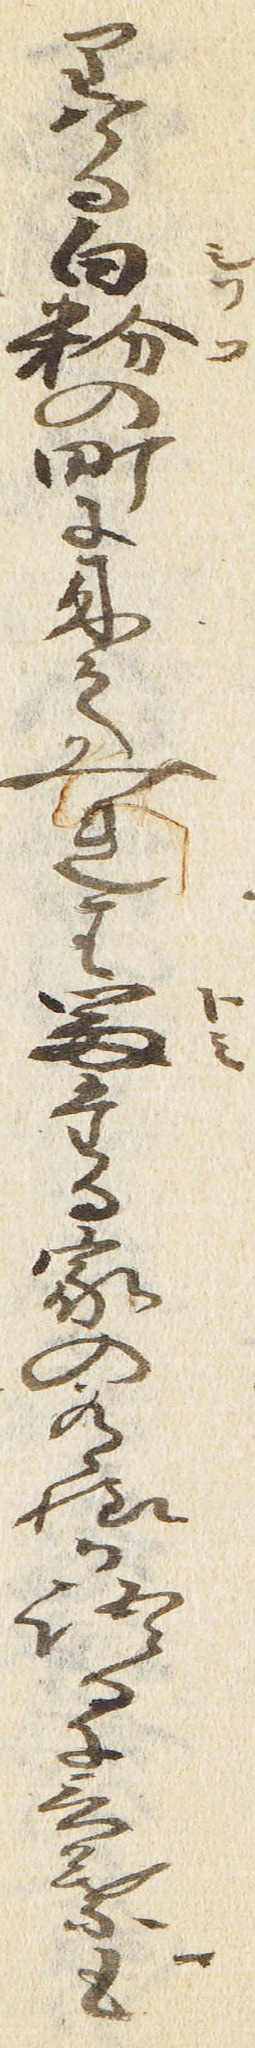りける白粉の町に来てみれは冨たる家の有様か語るに言葉も
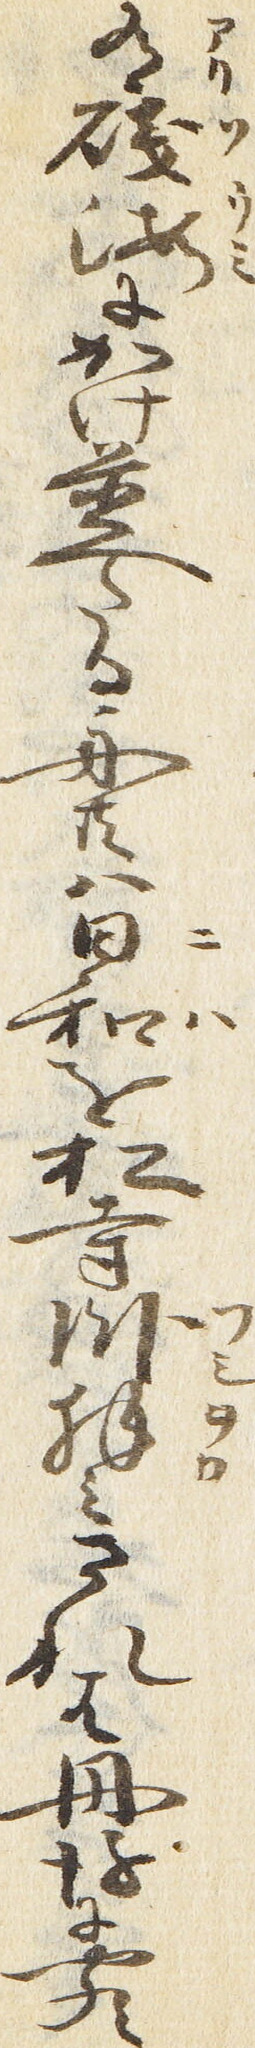有磯海にかけ並へたる舟共は日和を松寺臥拝みされは丹後に聞え
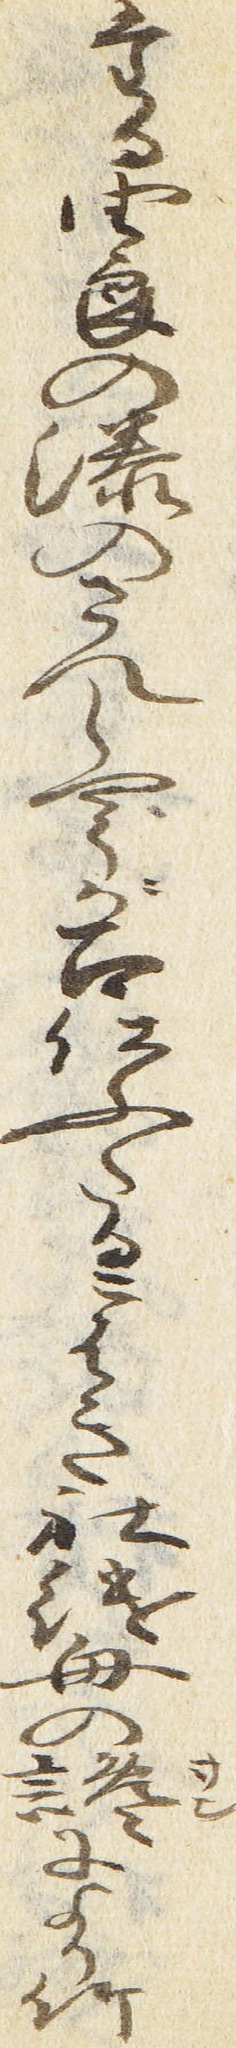たる由良の湊のさんしやうが召仕ふたるこはき社継母の讒により竹
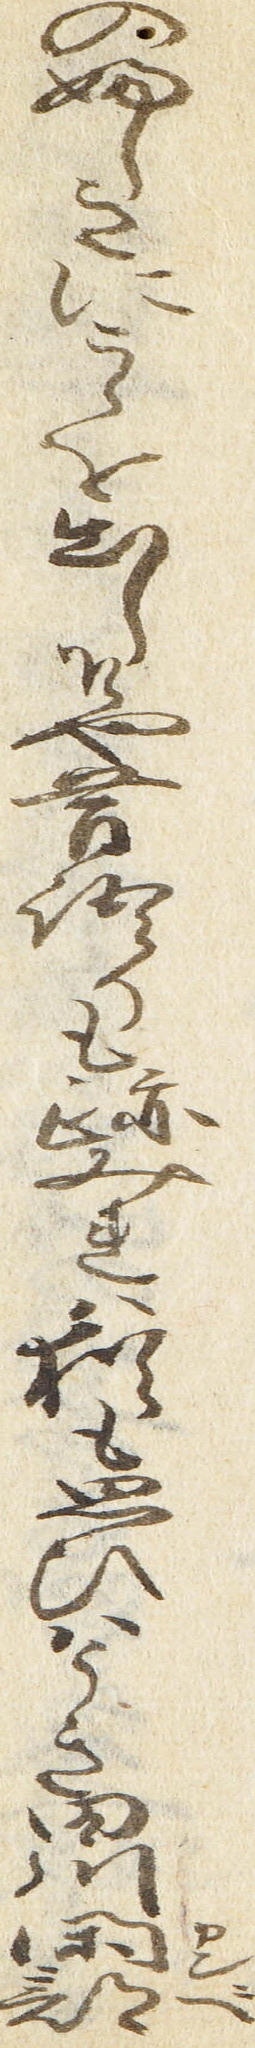のふしきにこらを出しそや昔語りも跡みれは猶も思ひはうき田川閑部
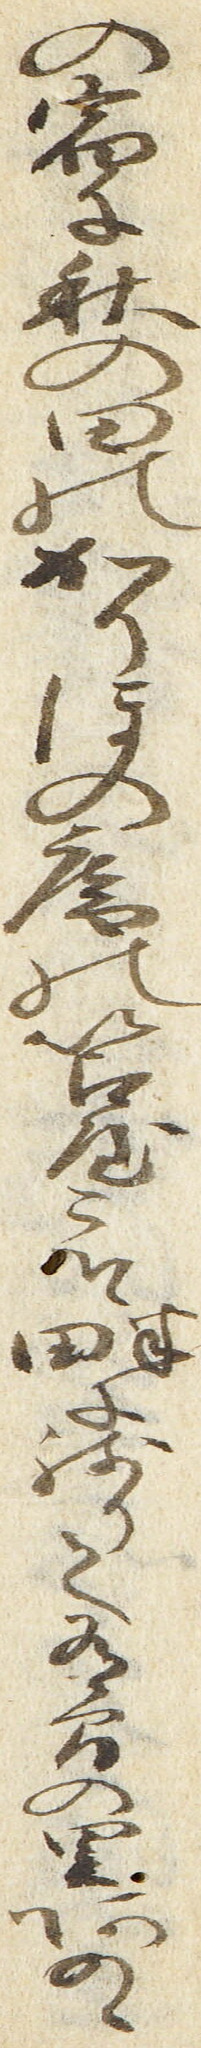の宿に秋の田のかりほの庵の苫屋こそ畔に残りて有間の里あのゝ

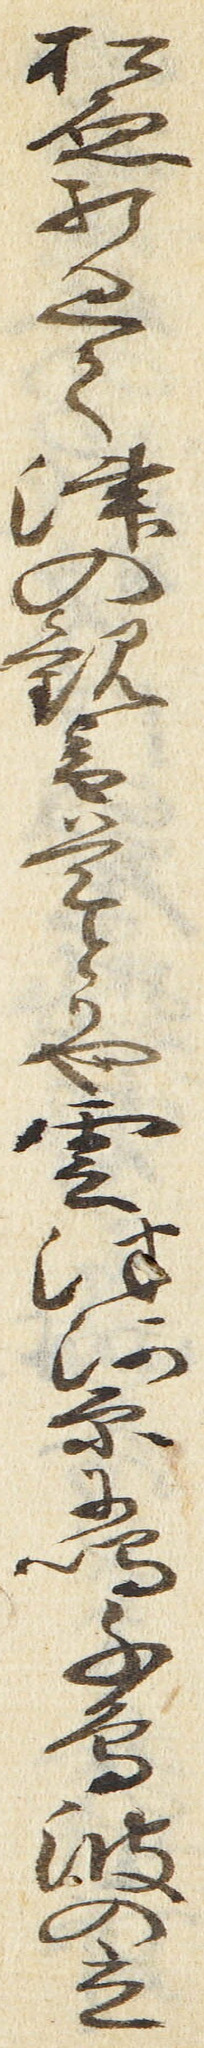松原打過て津の観音是とかや雲津河原に鳴千鳥波の立
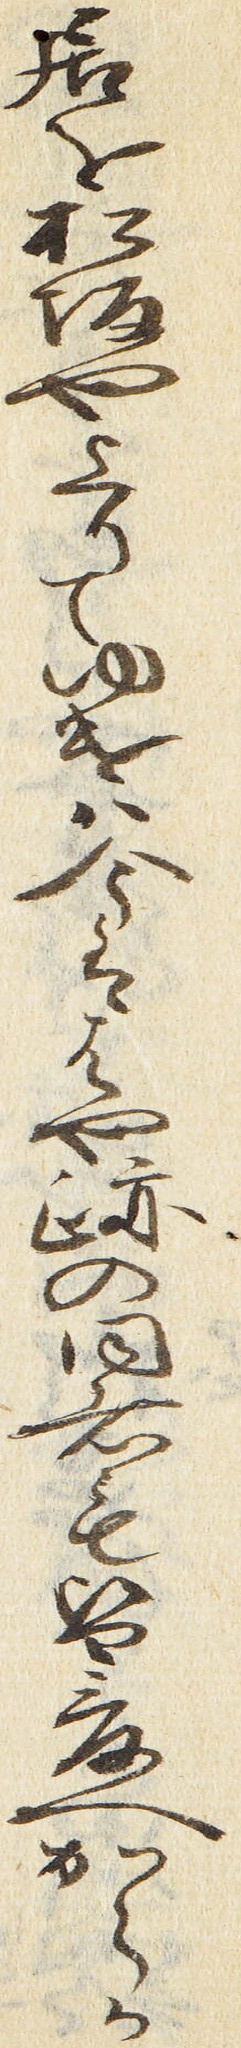居を松坂や上りてゆけは今ははや跡の同者も皆爰へからか
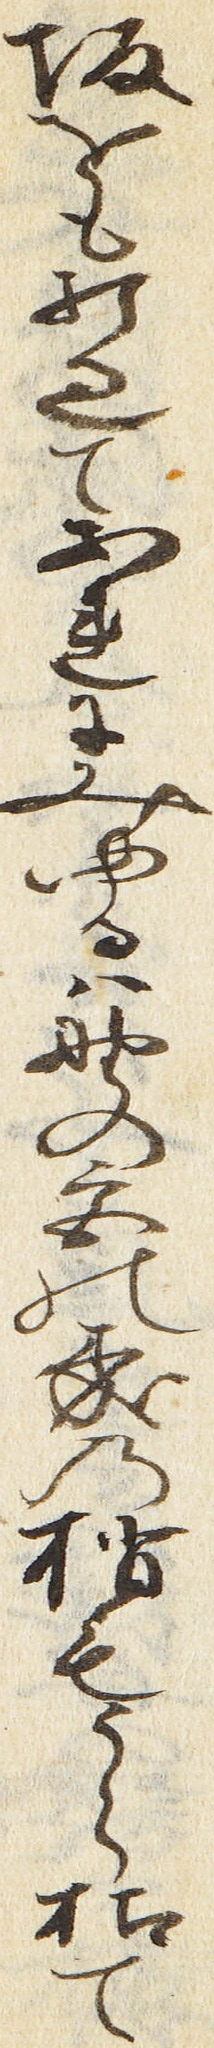坂をも打過てあれにみゆるは野の宮の森の梢もうら枯て
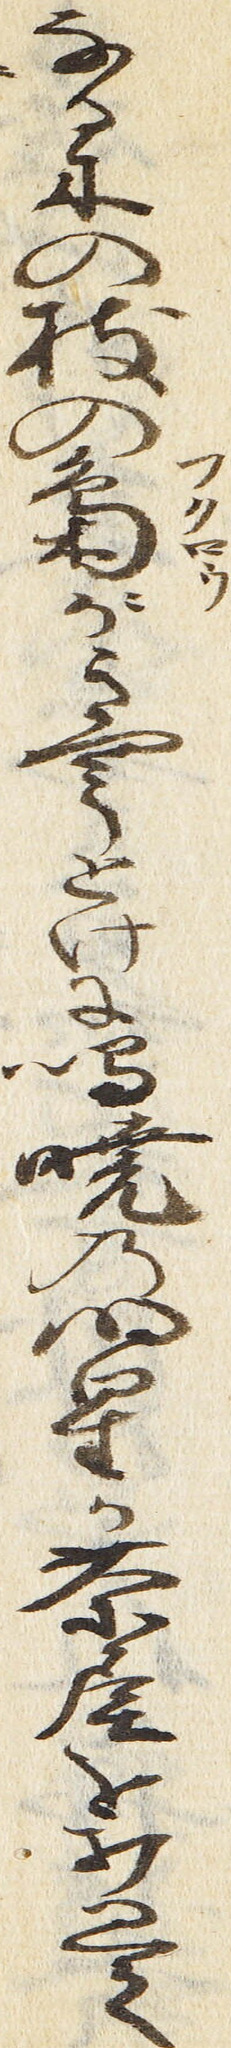なる木の枝の梟がきやうとけに鳴暁の明星か茶屋を打過て
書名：海陸世話日記
